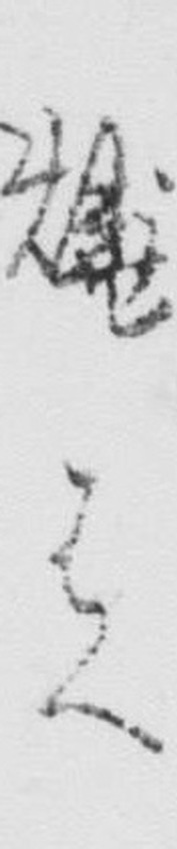焼はへ
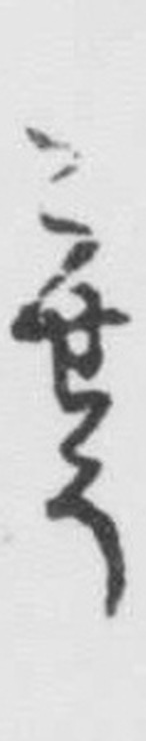こせう
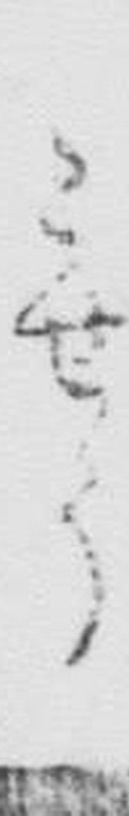こせう
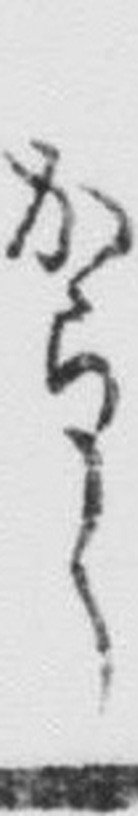からし
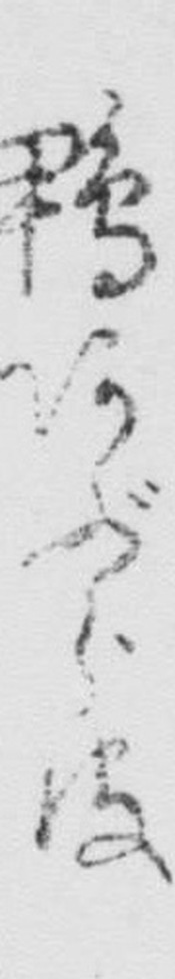鴨あぶら皮
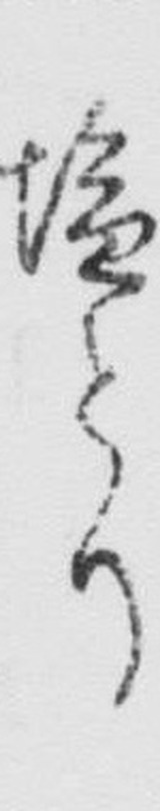塩とり
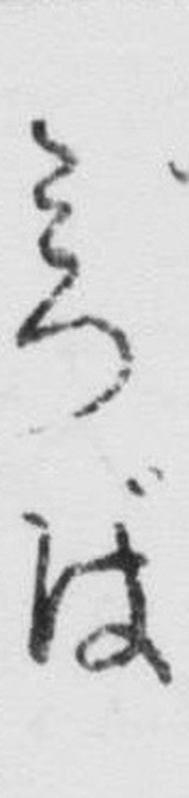みつば
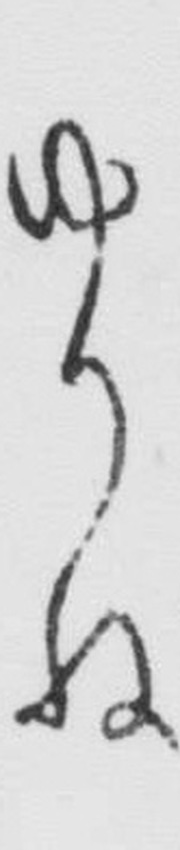ゆりね
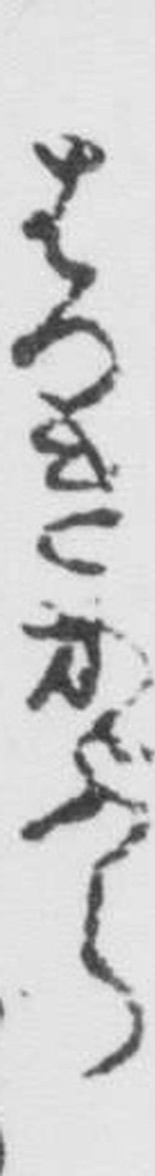はつきかぶら
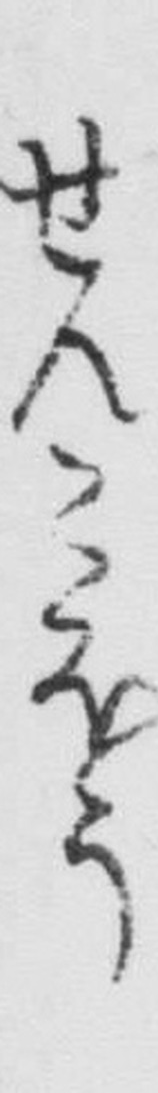せんこほう
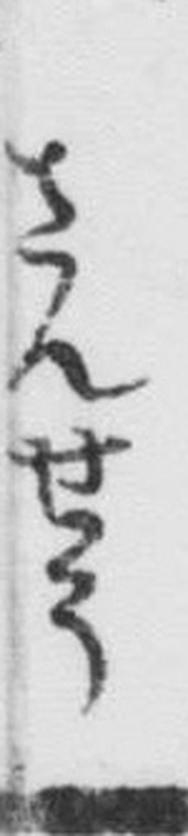さんせう
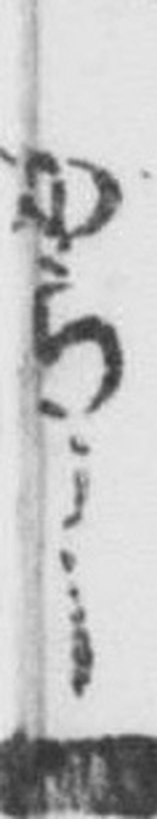からし

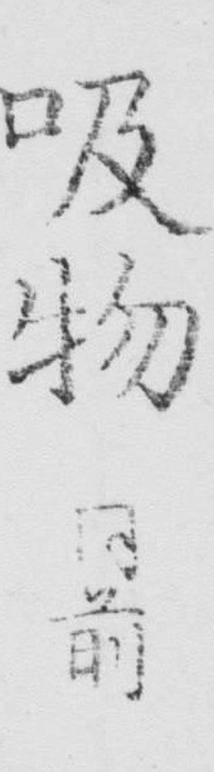吸物同前
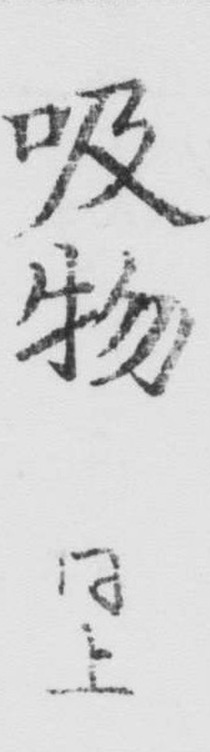吸物同上
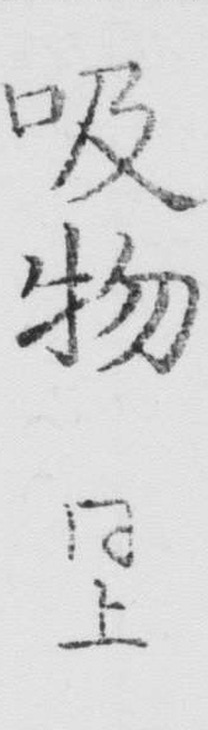吸物同上
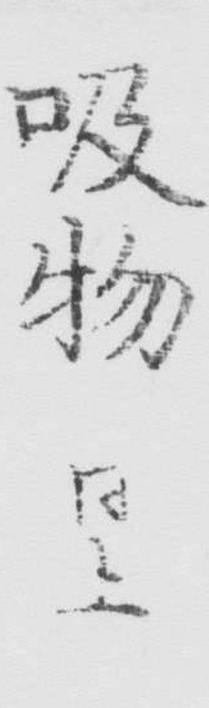吸物同上
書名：諸家通用/即席料理
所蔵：大阪府立大学学術情報センター 国文学研究資料館
